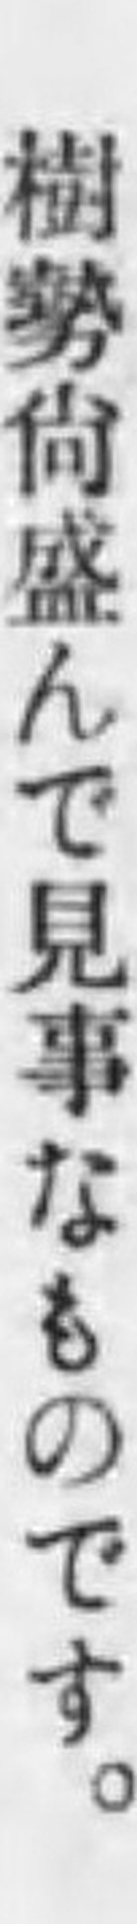樹勢尚盛んで見事なものです。
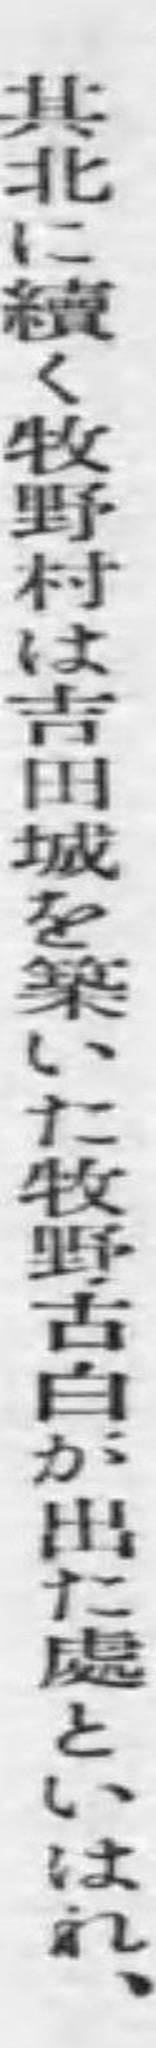其北に続く牧野村は吉田城を築いた牧野古白が出た処といはれ、
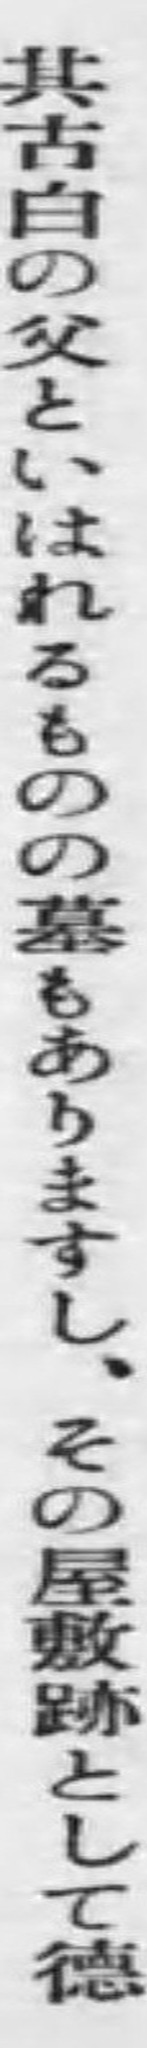其古白の父といはれるものの墓もありますし、その屋敷跡として徳
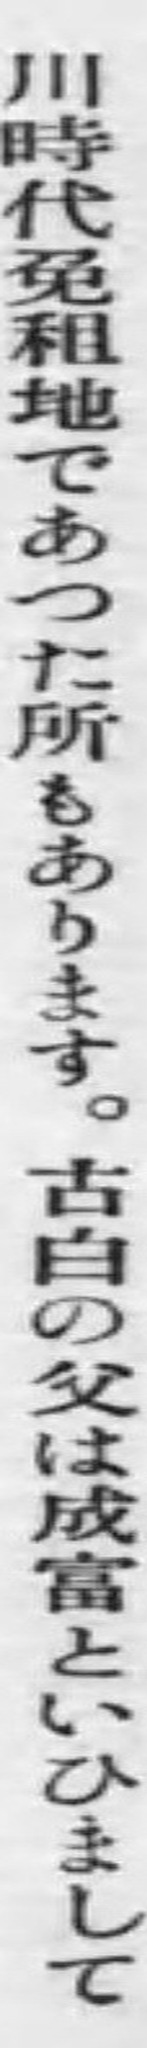川時代免租地であつた所もあります。古白の父は成富といひまして
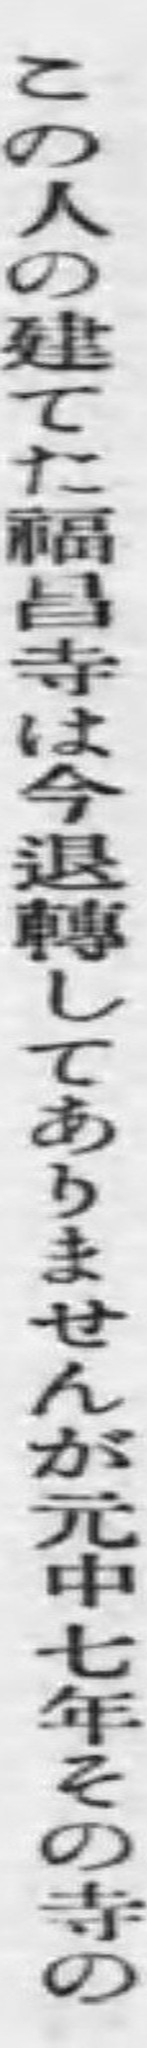この人の建てた福昌寺は今退転してありませんが元中七年その寺の
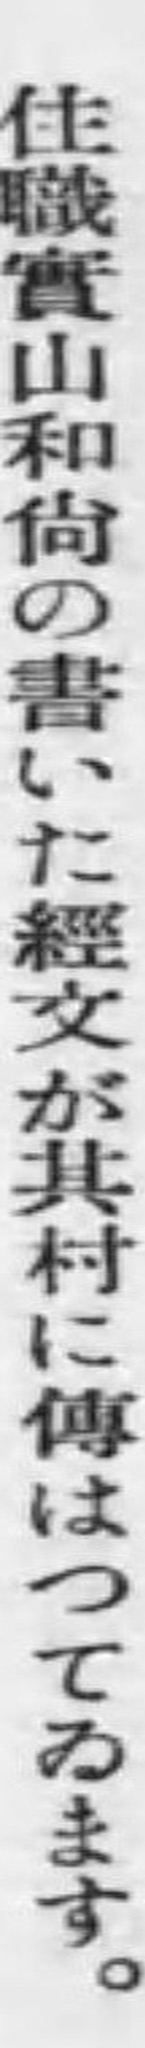住職実山和尚の書いた経文が其村に伝はつてゐます。
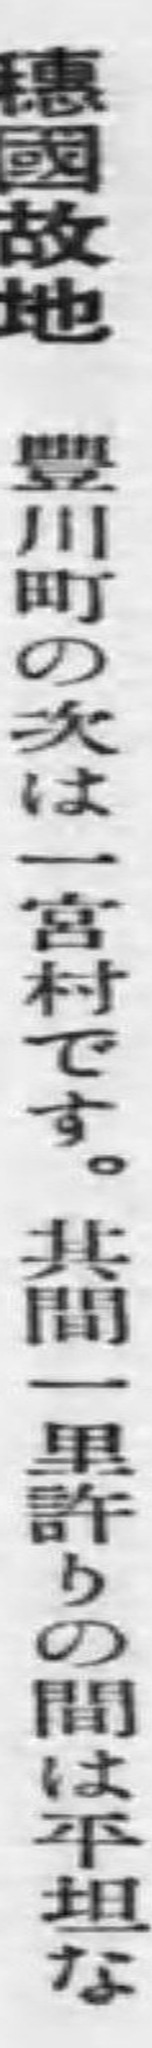穂国故地豊川町の次は一宮村です。其間一里許りの間は平坦な
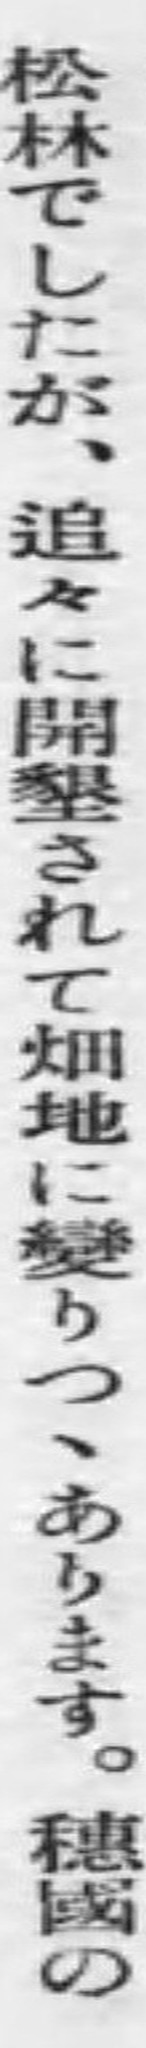松林でしたが、追々に開墾されて畑地に変りつゝあります。穂国の
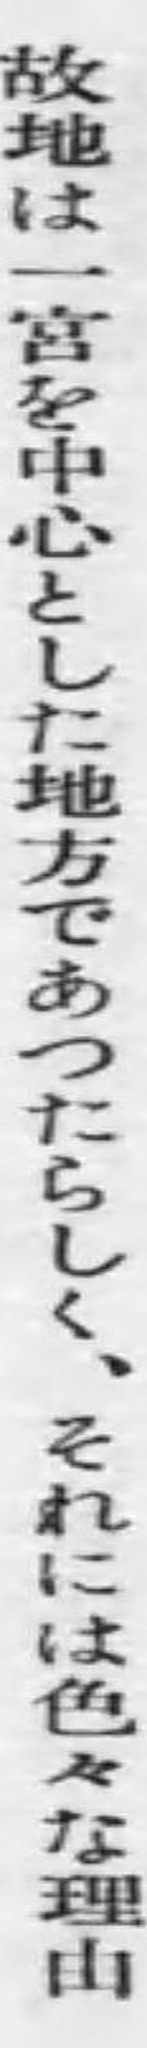故地は一宮を中心とした地方であつたらしく、それには色々な理由
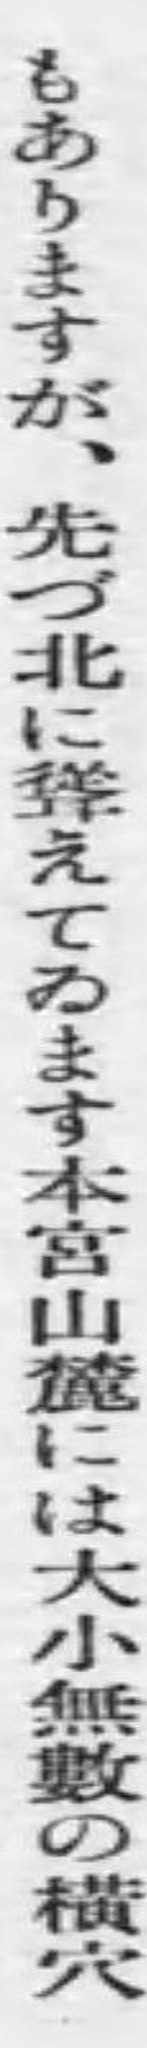もありますが、先づ北に聳えてゐます本宮山麓には大小無数の横穴
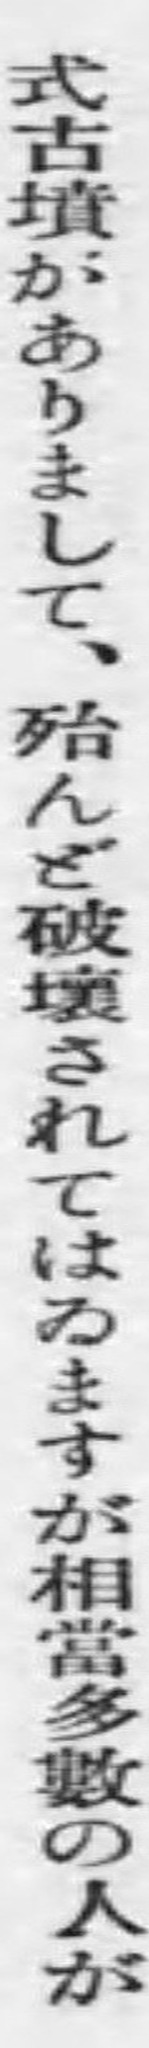式古墳がありまして、殆んど破壊されてはゐますが相当多数の人が
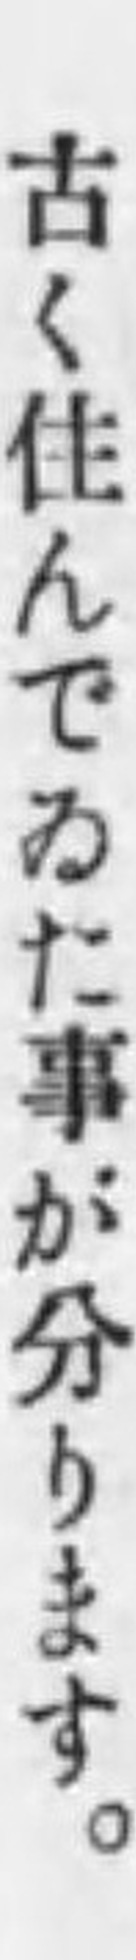古く住んでゐた事が分ります。
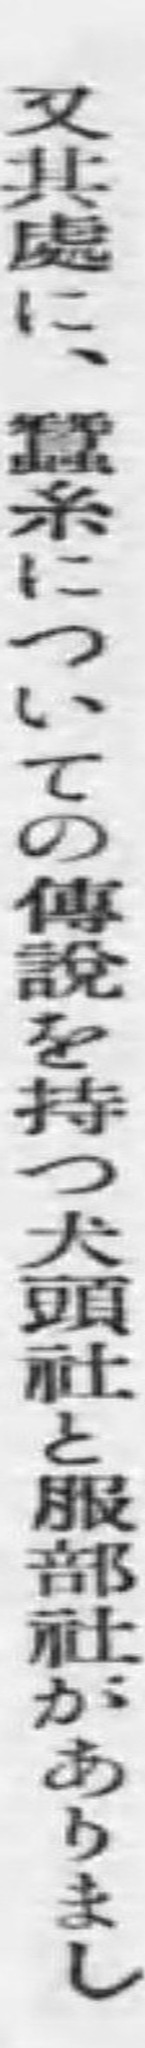又其処に、蚕糸についての伝説を持つ犬頭社と服部社がありまし
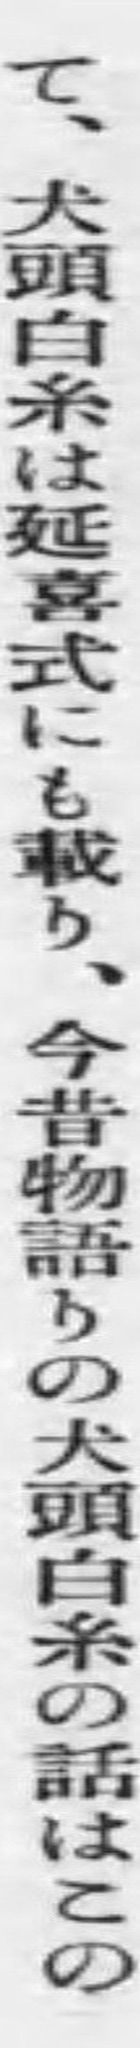て、犬頭白糸は延喜式にも載り、今昔物語りの犬頭白糸の話はこの
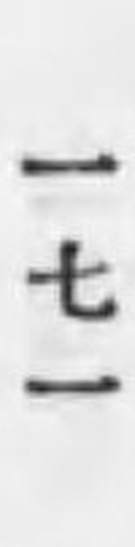一七一

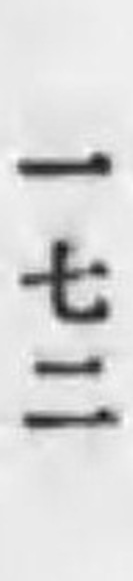一七二
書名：東三河道中記 : 豊橋市及其附近案内
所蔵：国立国会図書館 National Diet Library, JAPAN
